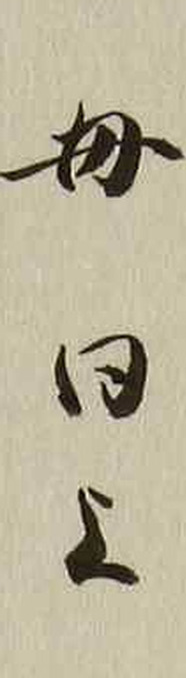母同上
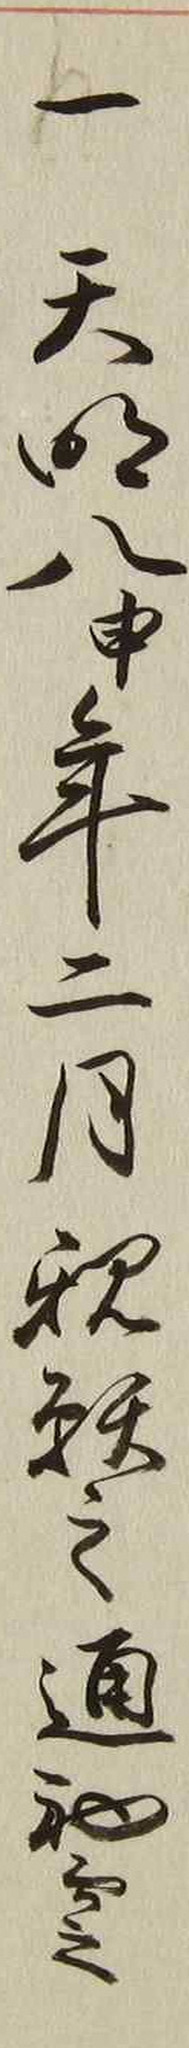一天明八申年二月親願之通初而之
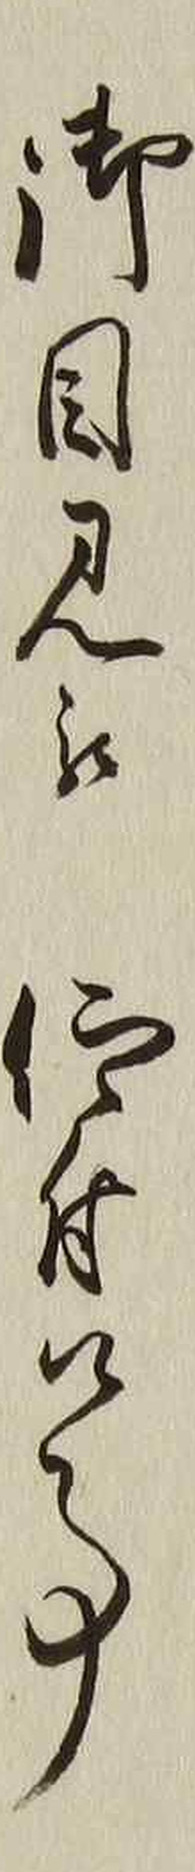御目見被仰付候事
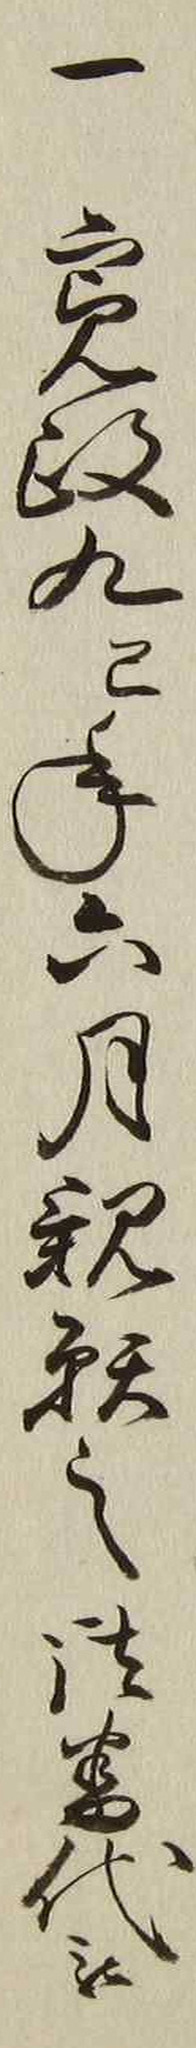一寛政九巳年六月親願之御番代被
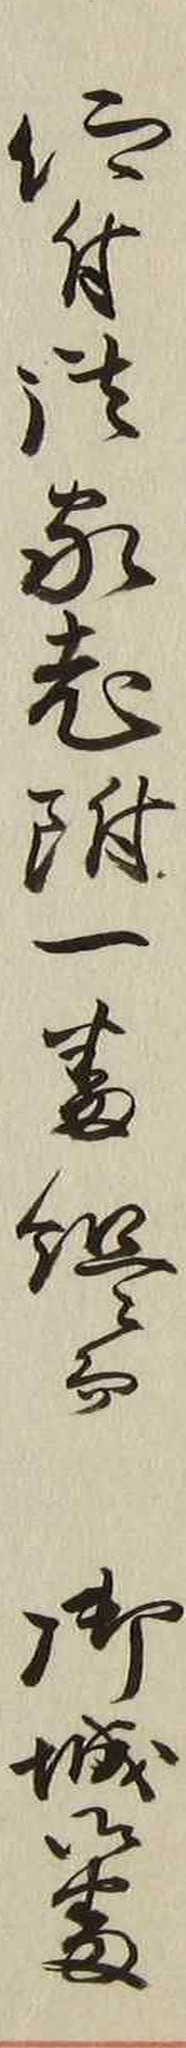仰付御家老附一番組ニ而御城御番
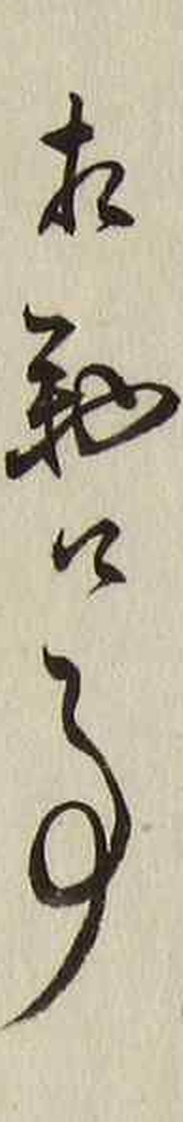相勤候事
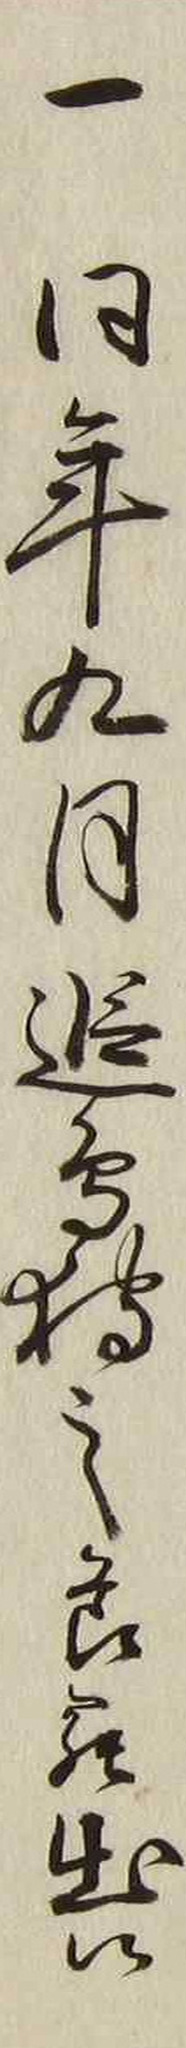一同年九月追鳥狩之節罷出候
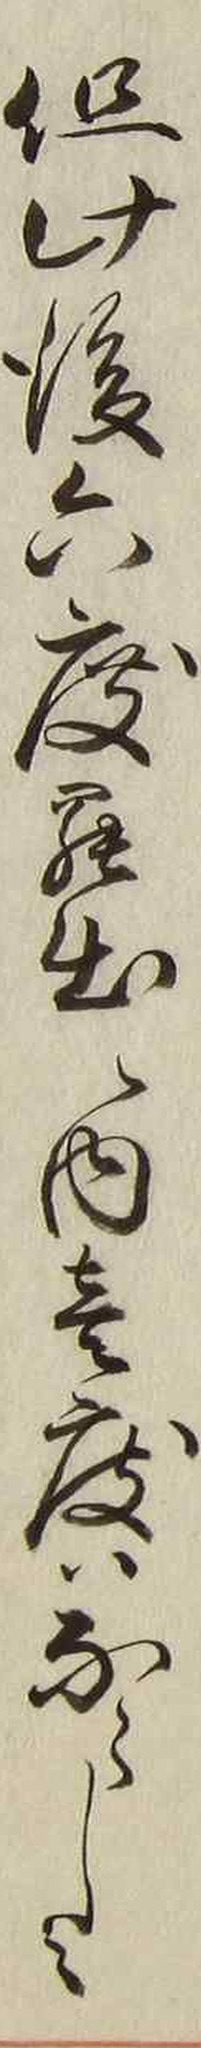但此後六度罷出候内壱度ハならし之
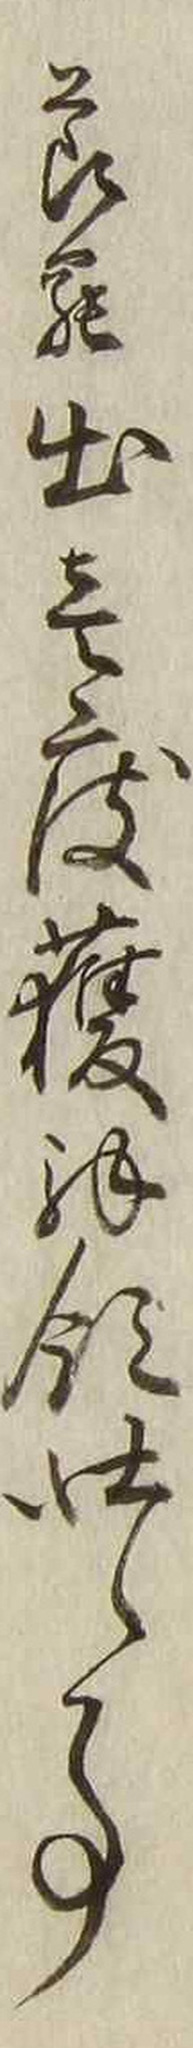節罷出壱度獲拝領仕候事

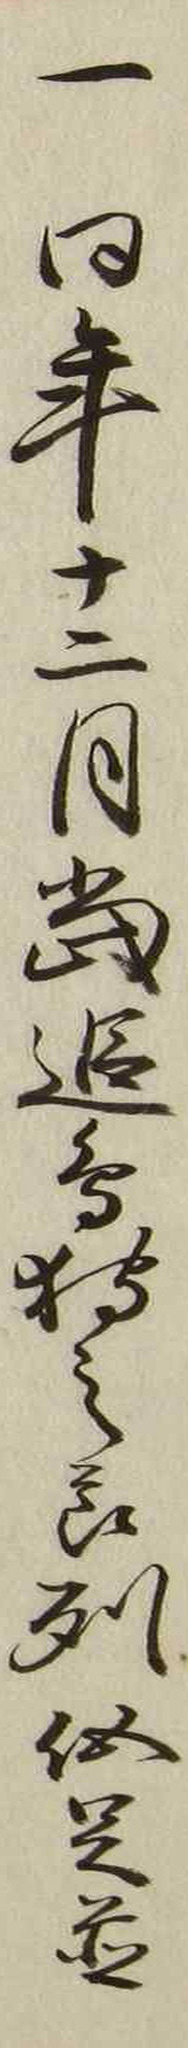一同年十二月当追鳥狩之節列伍足並
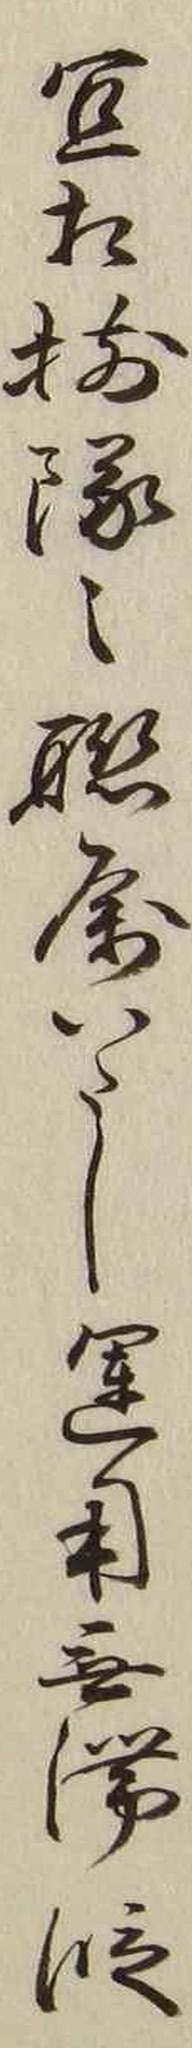宜相揃隊之聯属いたし運用無滞段
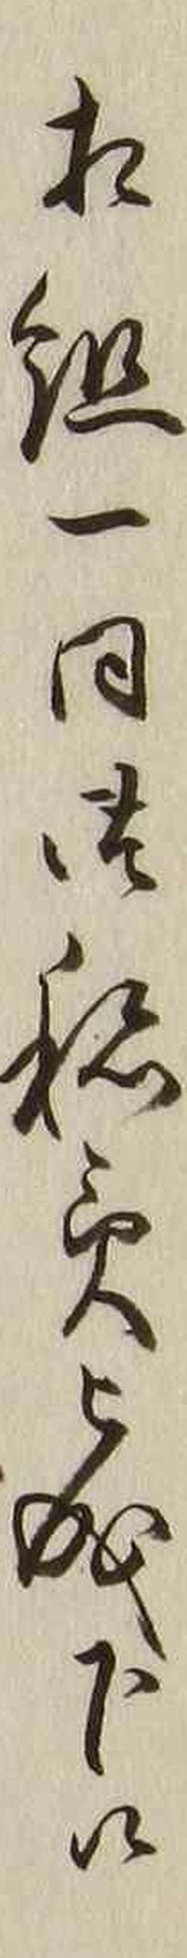相組一同御称美被成下候
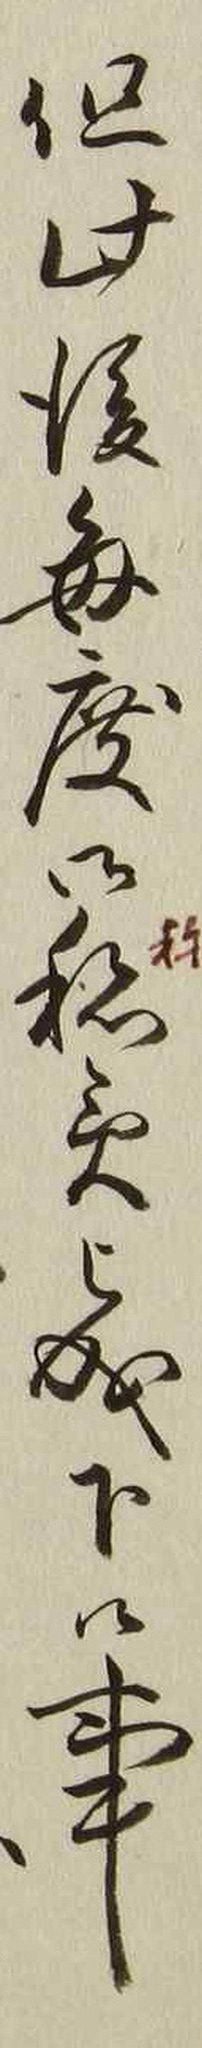但此後毎度御称美被成下候事
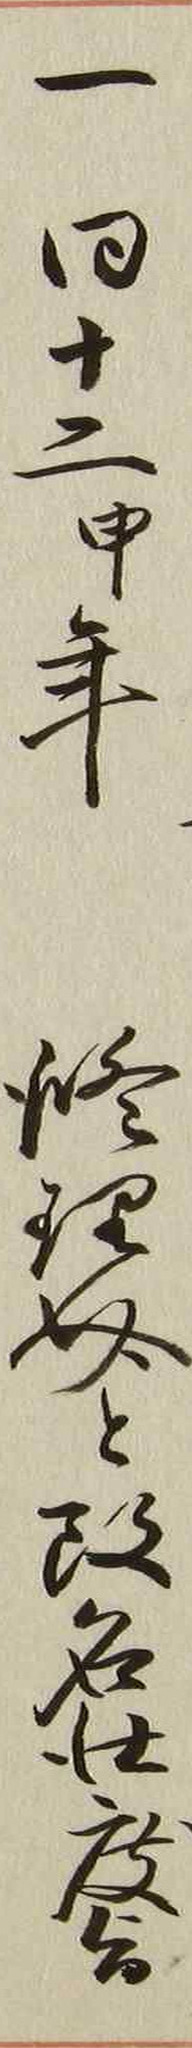一同十二申年修理介と改名仕度旨
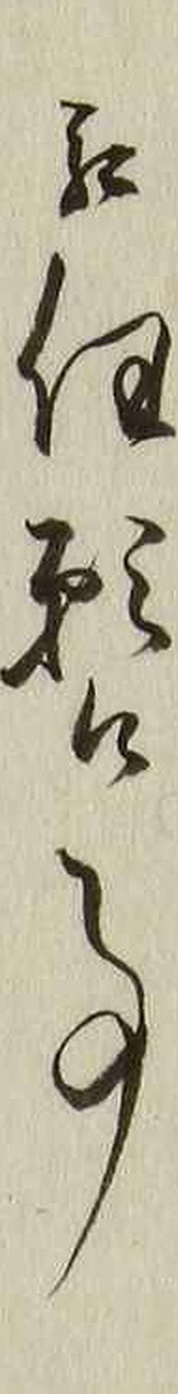被任願候事
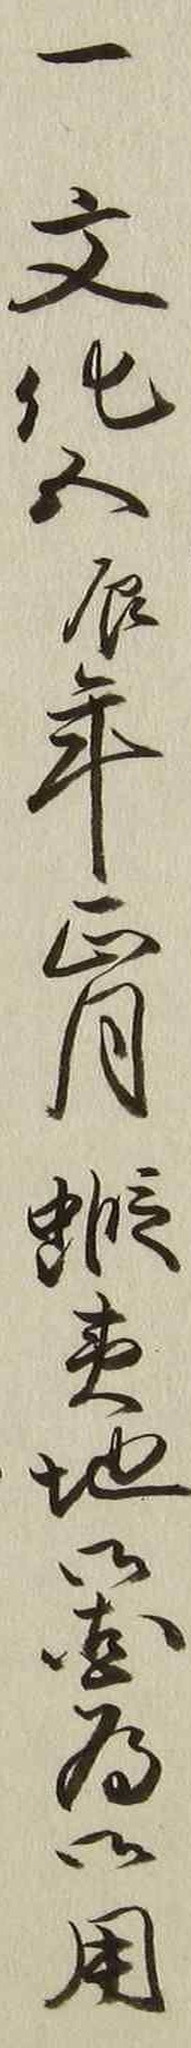一文化五辰年正月蝦夷地御固為御用
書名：諸士系譜　巻之21　い之部21
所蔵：会津若松市立会津図書館
